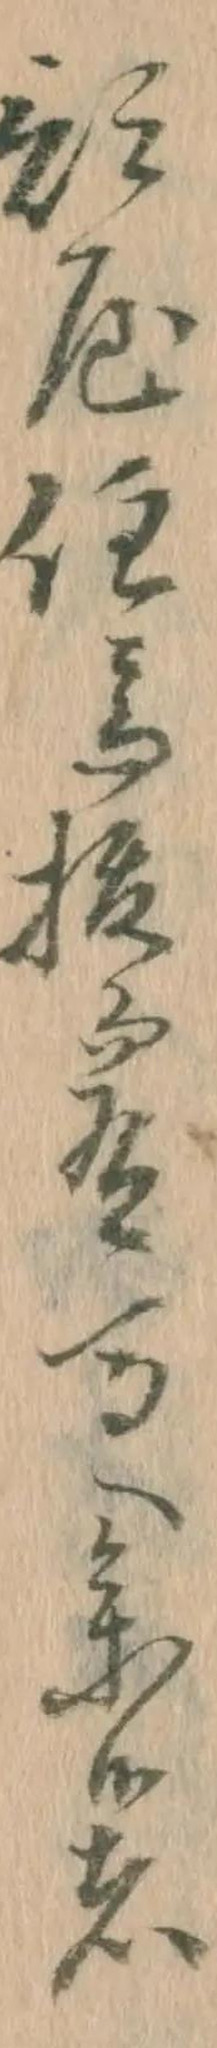預屋住に而抜而有馬へ参候者
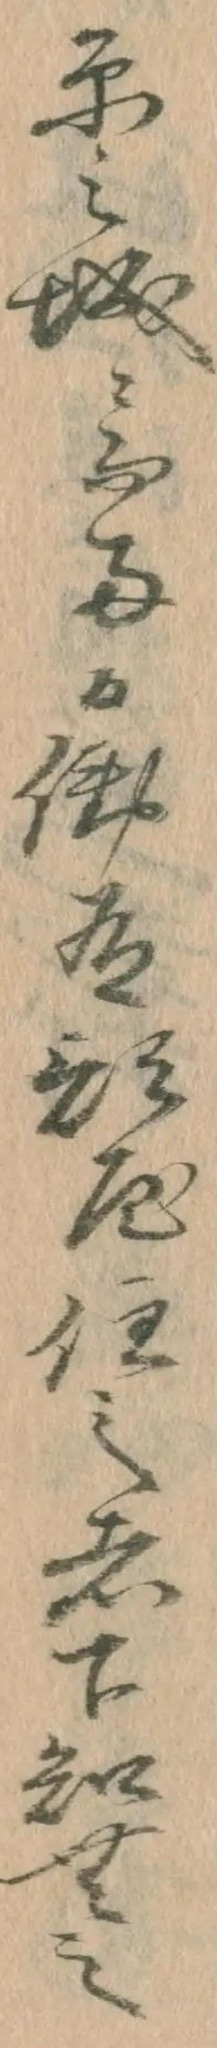原之城に而多る働有預屋住之者下知無之
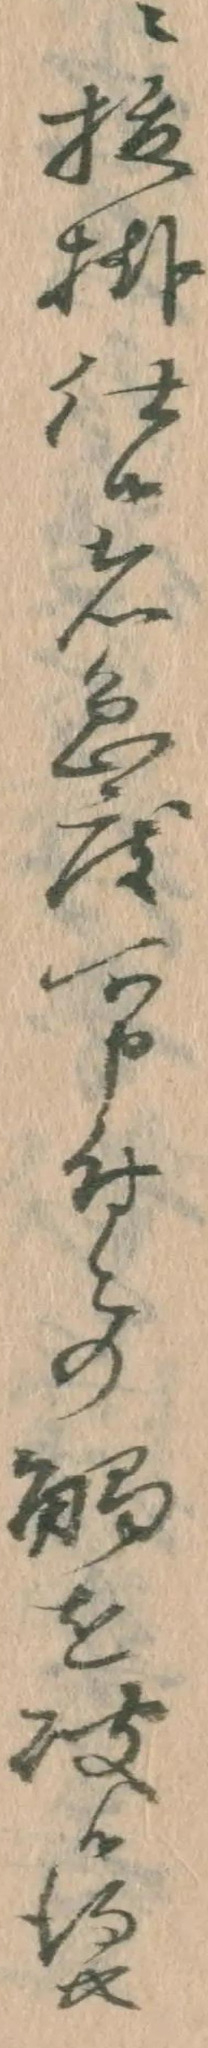に抜掛仕候者急度可申付との觸を破候得共
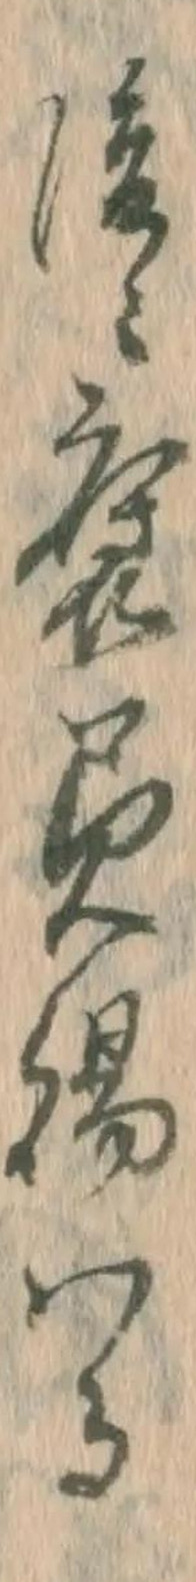後に褒美賜はる
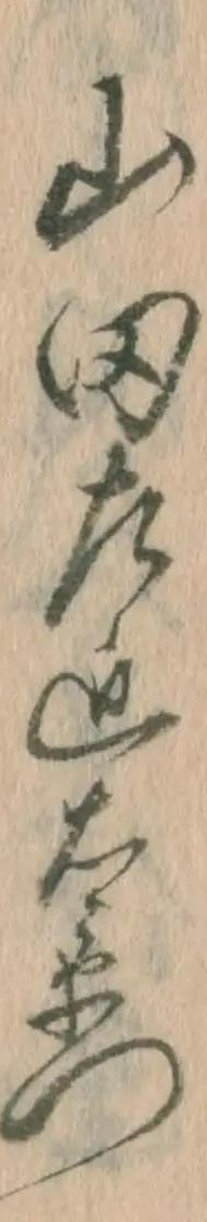山田左近右衛門
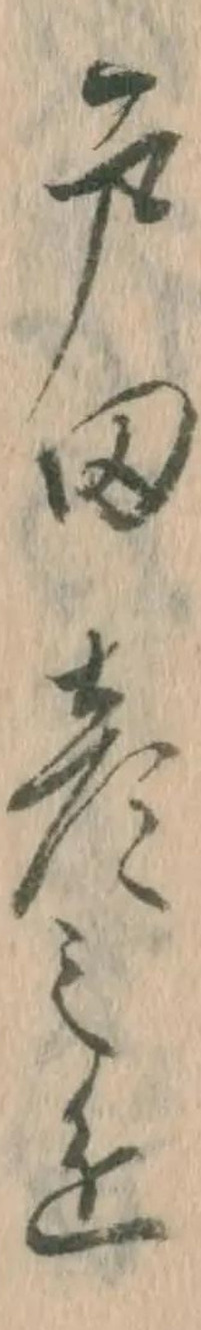戸田彦之進
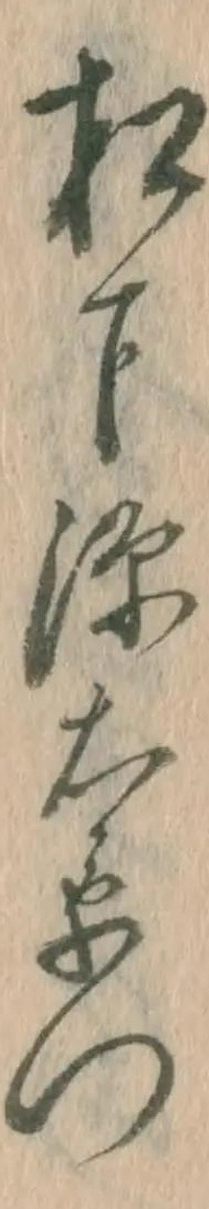松下源右衛門
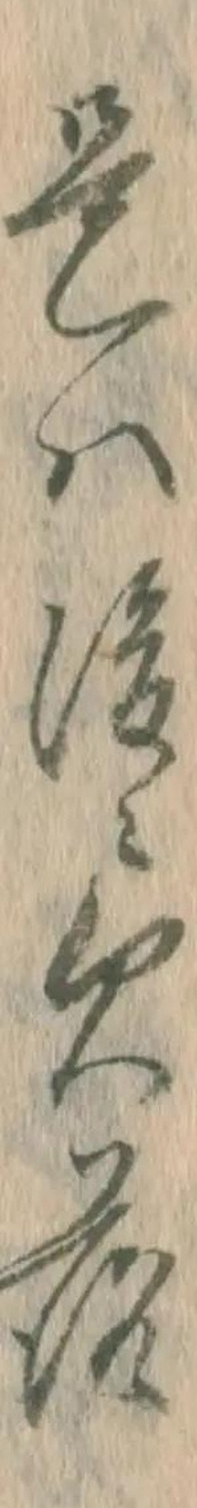是は後に欠落
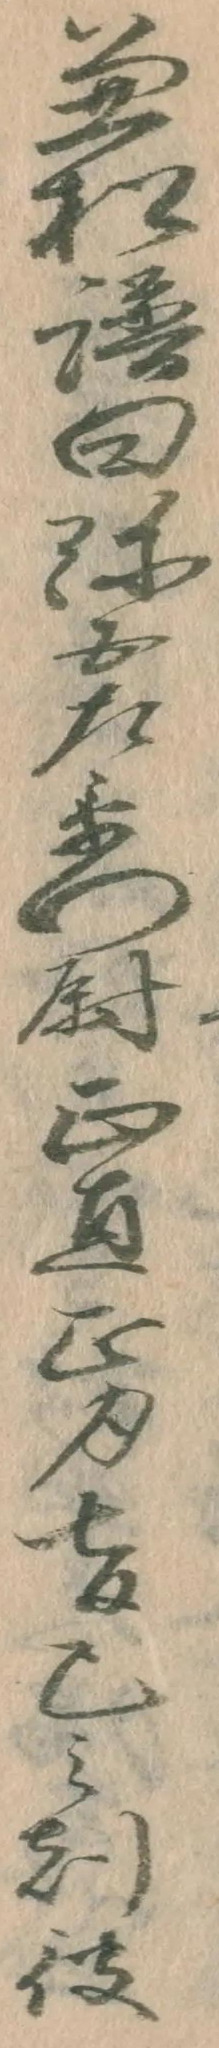兼松譜曰弥五左衛門尉正直正月七日巳之刻彼
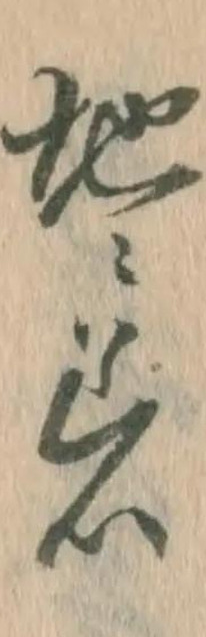地に着
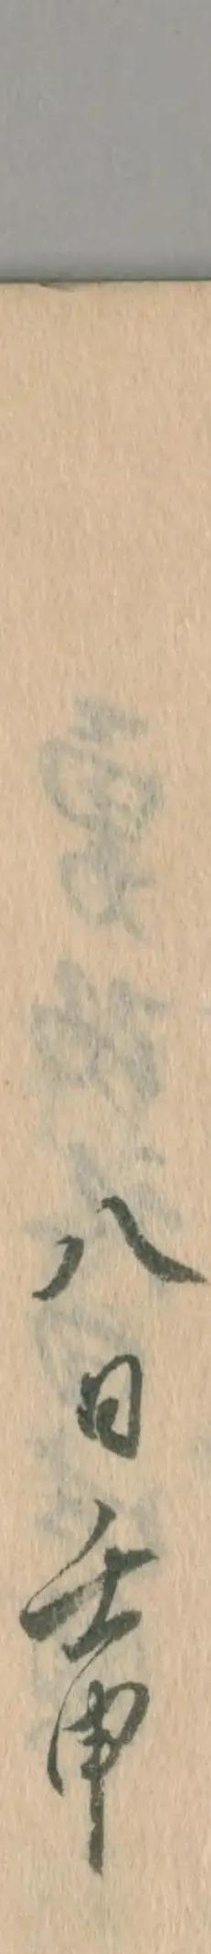八日壬申
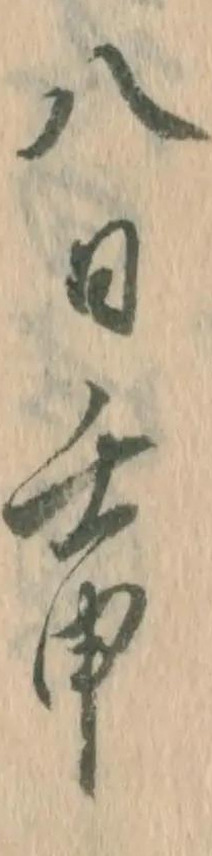八日壬申

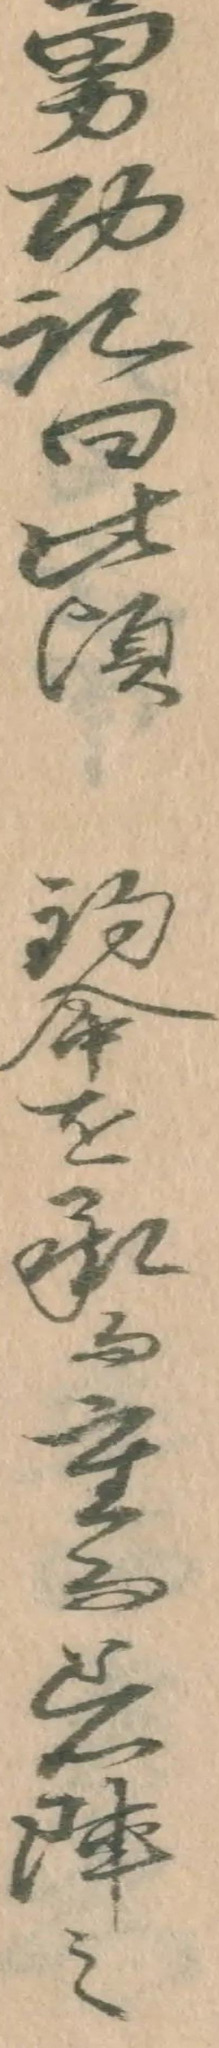勇功記曰此頃釣命を承而重而着陣之
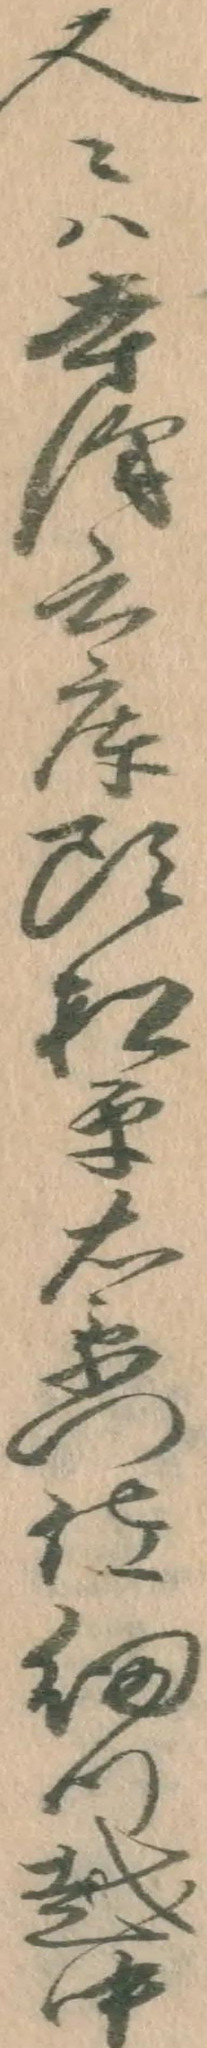人々は寺沢兵庫頭松原右衛門左細川越中
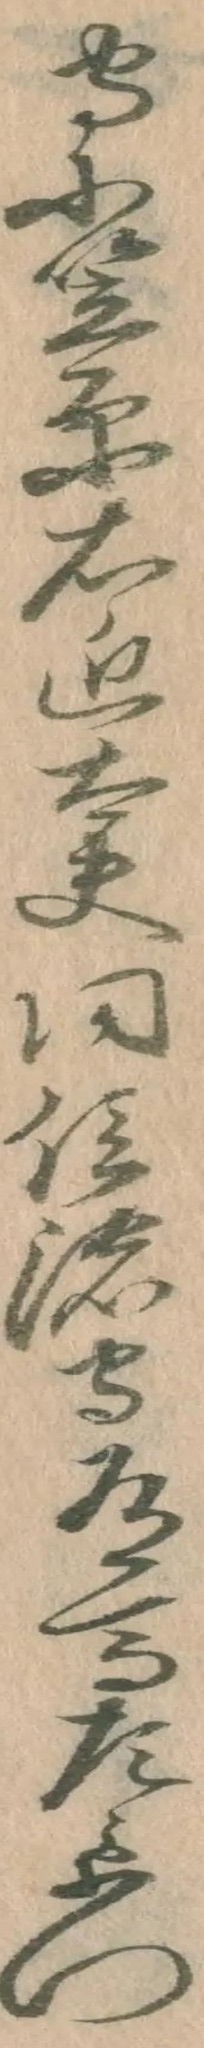守小笠原右近太夫同信濃守有馬左衛門
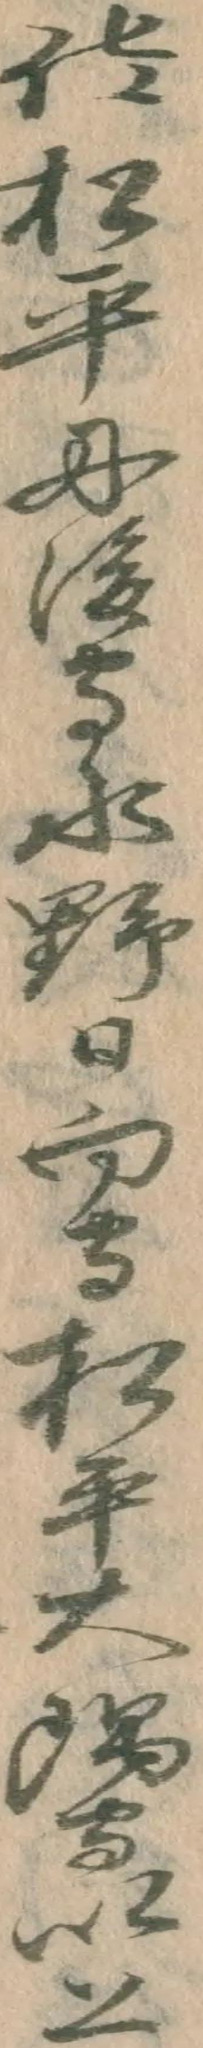左松平丹後守水野日向守松平大隅守以上
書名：切支丹御退治記 49巻. [5]
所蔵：国立国会図書館 National Diet Library, JAPAN
